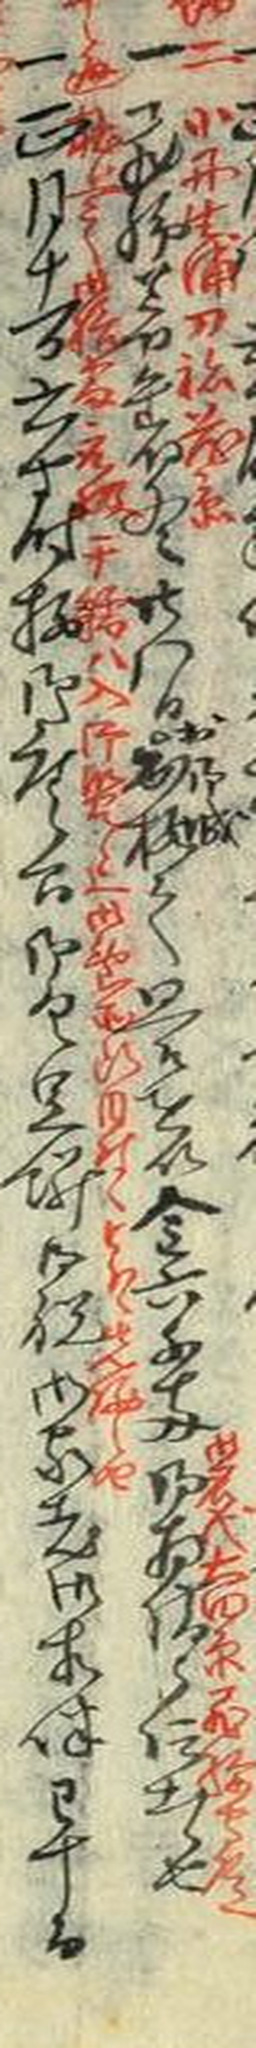一正月十一日六半時揃御座之間御具足餅御祝御家老御相伴畢而
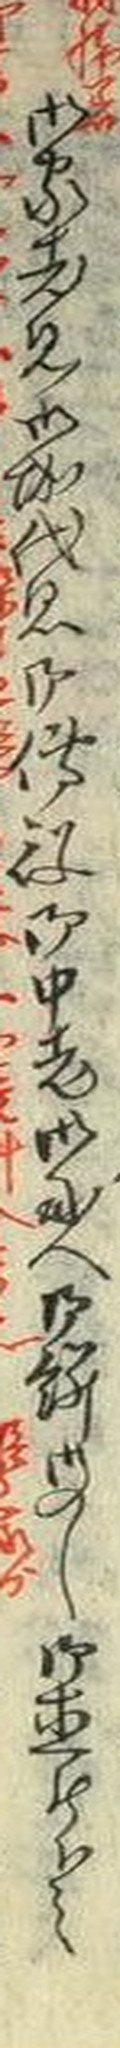御家老息御城代息御傅役御中老御用人御餅御のし御直被下之
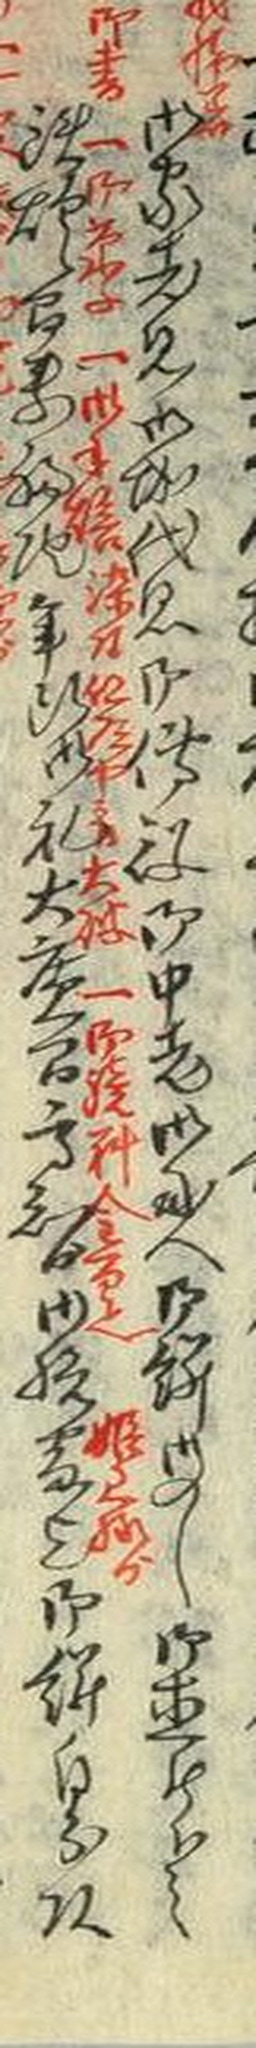鉄炮之間寿福院年頭御礼大広間高知ゟ御膳番迄御餅自分頂
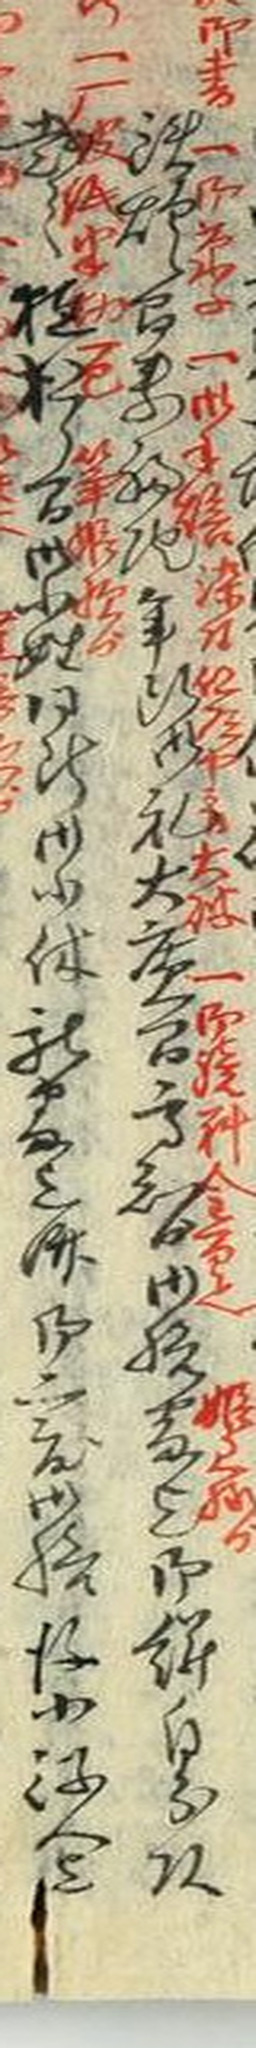戴之韃靼之間御小姓同断御小休新番迄済御二度御膳後小役人迄
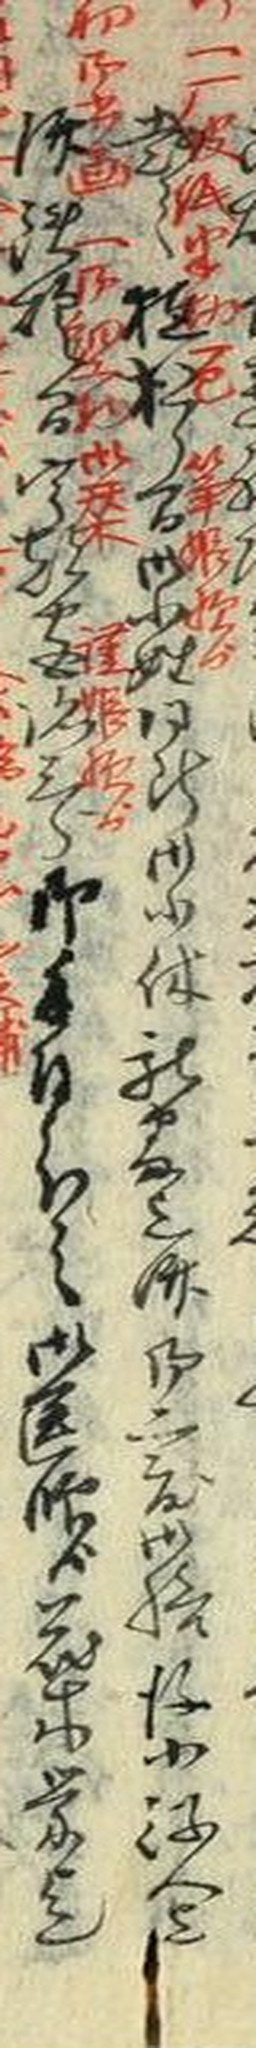済鉄炮之間宇都宮弥三郎御手自被下之御医師ゟ花木栄迄
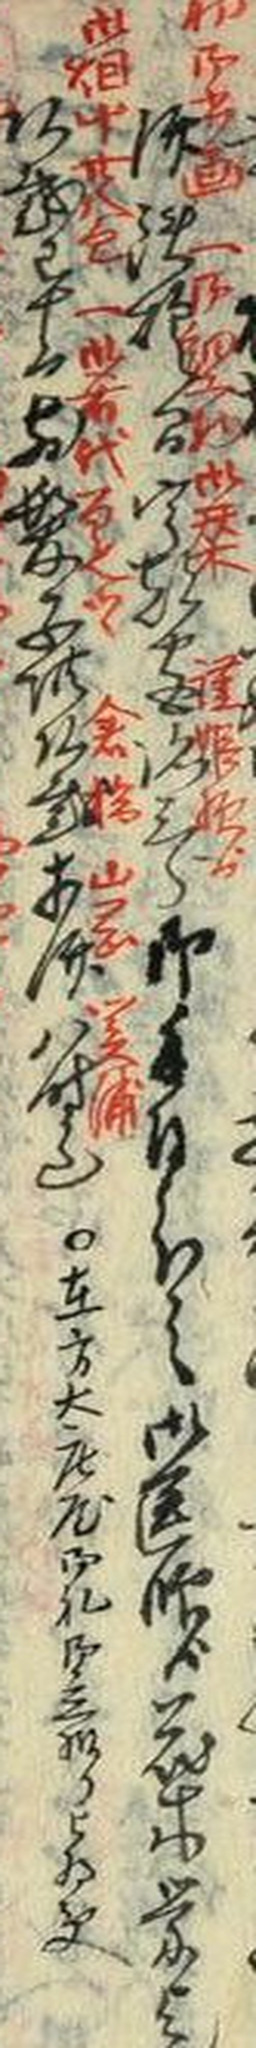頂戴畢而前髪子供頂戴相済八時過〇在方大庄屋御礼御立掛り被為受

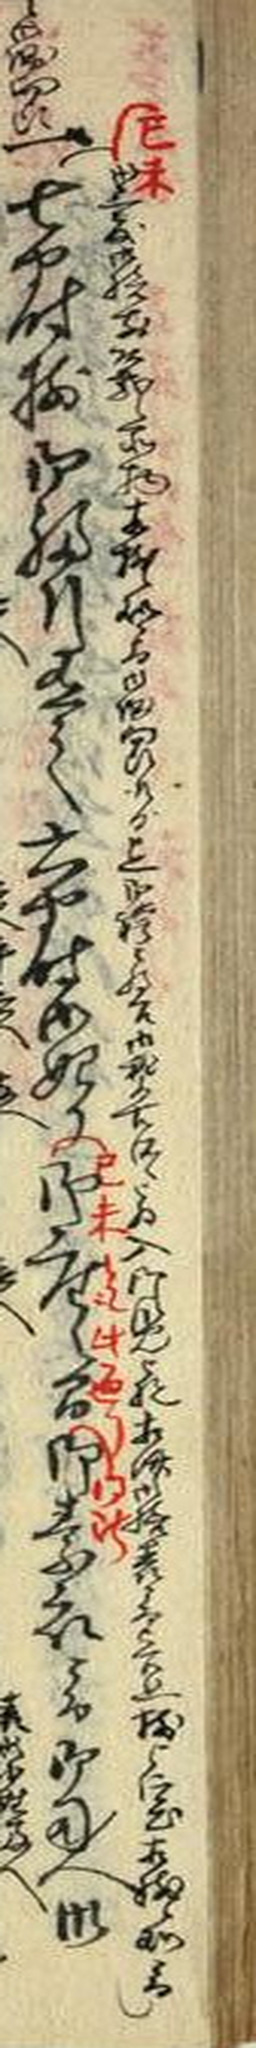一七半時揃御福引有之六半時御始り御座之間御素衣ニ而御用人御
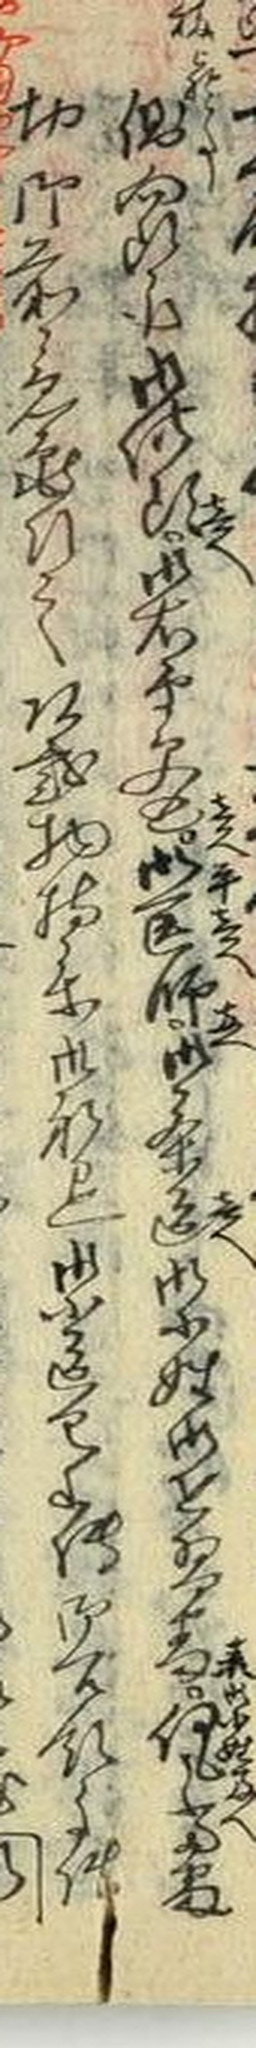切御前ニ而鬮引之頂戴物持参御礼申上御小道具手伝御召領手伝
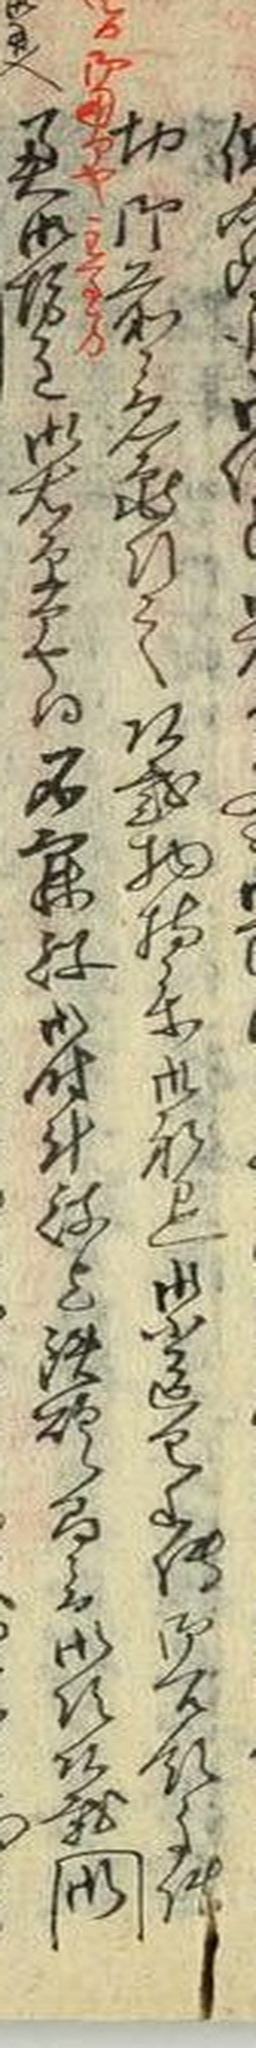奥御坊主御右筆部や向不寝役御時計役迄鉄炮之間ニ而御次頂戴御
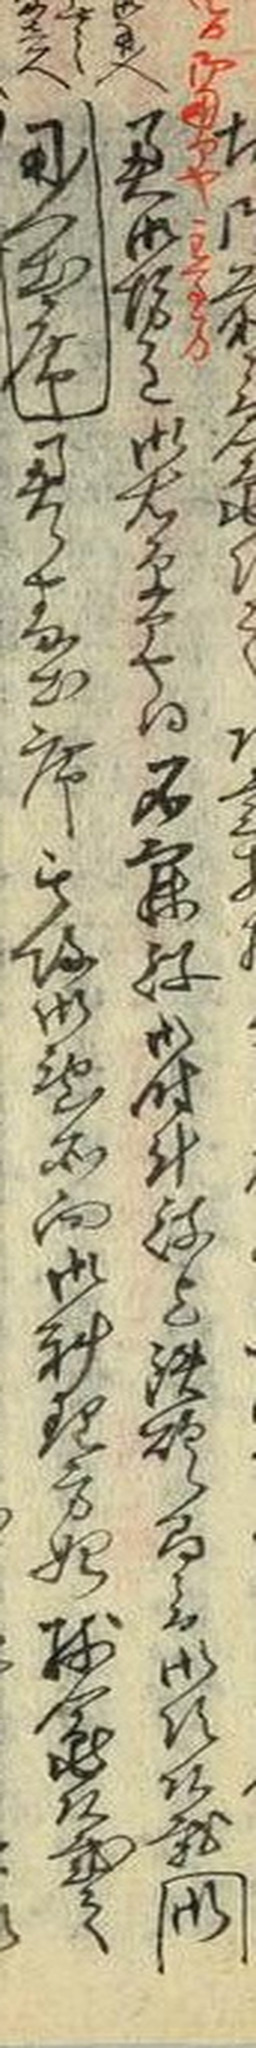用人出席奥之番出席其余御台所向御料理方始残鬮頂戴之
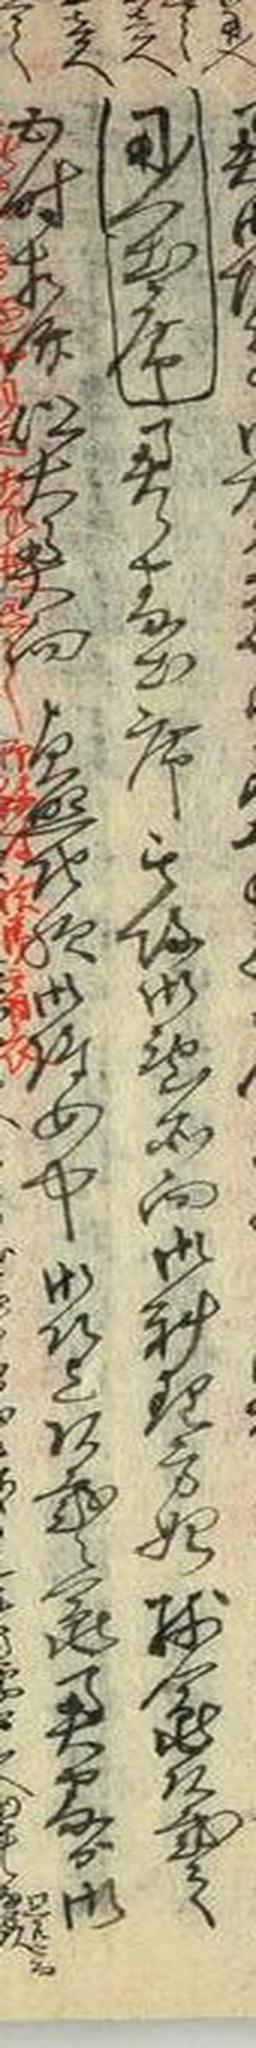五時相済但大奥向貞照院様御附女中御次迄頂戴之鬮奥番ゟ御
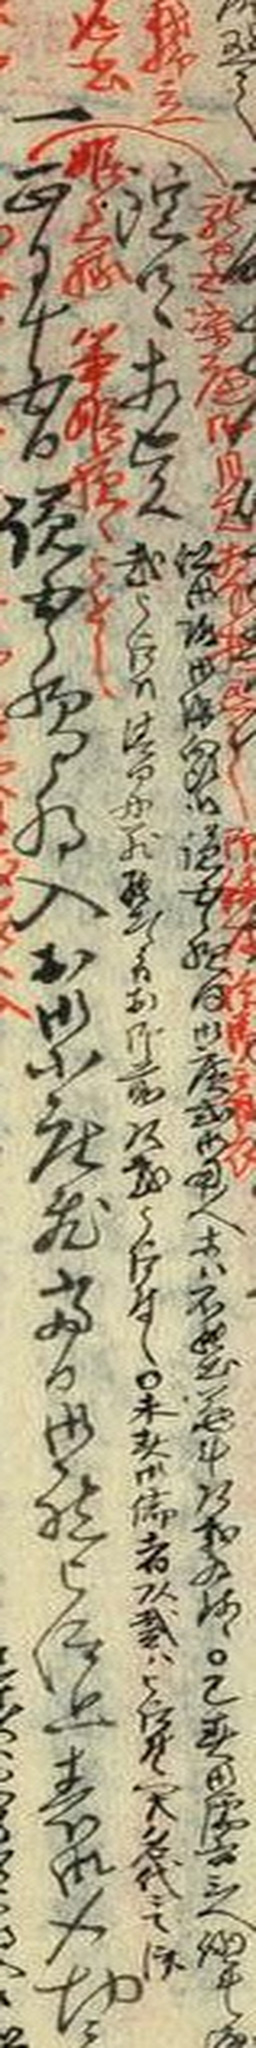一正月十五日謙五郎様被為入於御小座敷当日御礼被仰上表御〆切ニ而
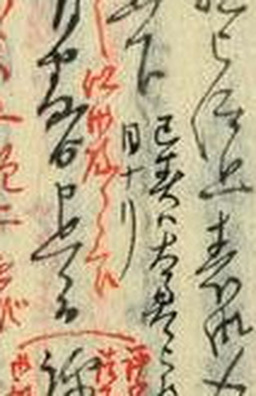日ナリ
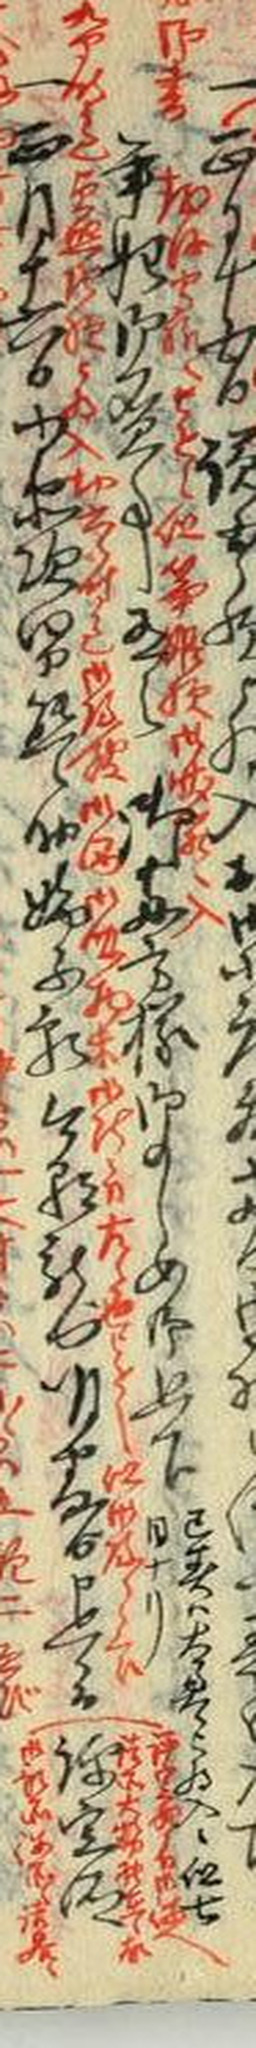一正月十六日小兵衛次男熊之助嫡子願今朝新右衛門明番ゟ申上候而評定所へ
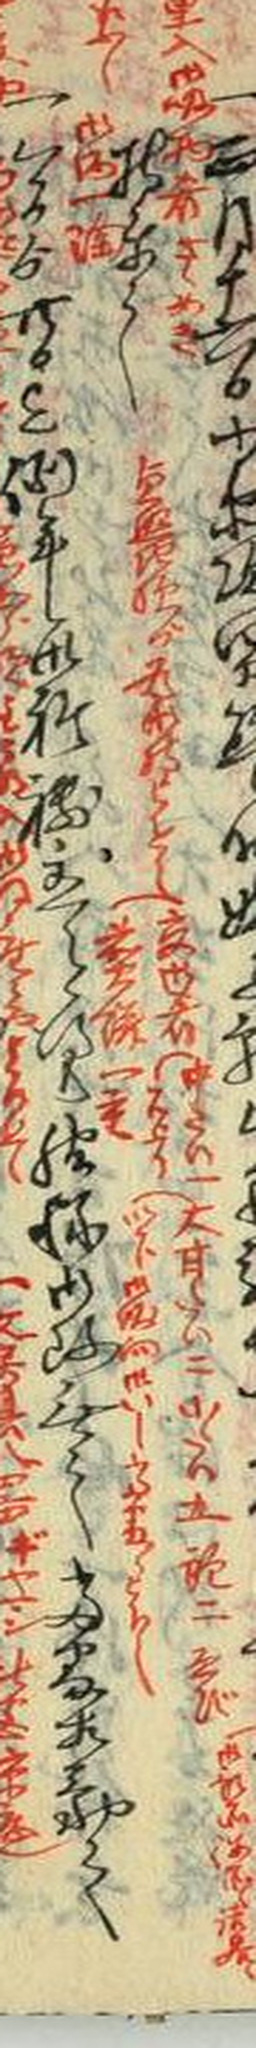一今日ゟ廿日迄例年之御祈祷有之候得共服穢御改無之当番相勤之
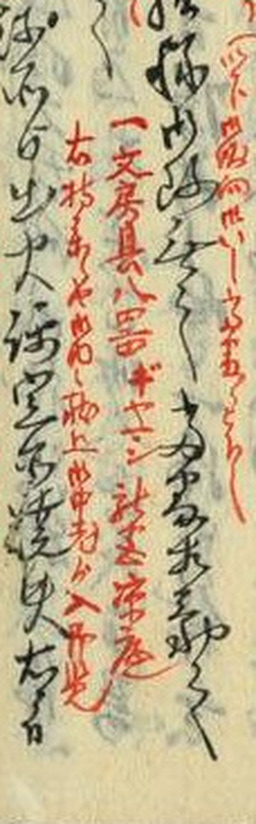一文房具八器ギヤマン新宮涼庭
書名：少傅日録抄（斉承付側向頭取日記、在国）
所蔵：福井県文書館 Fukui Prefectural Archives
